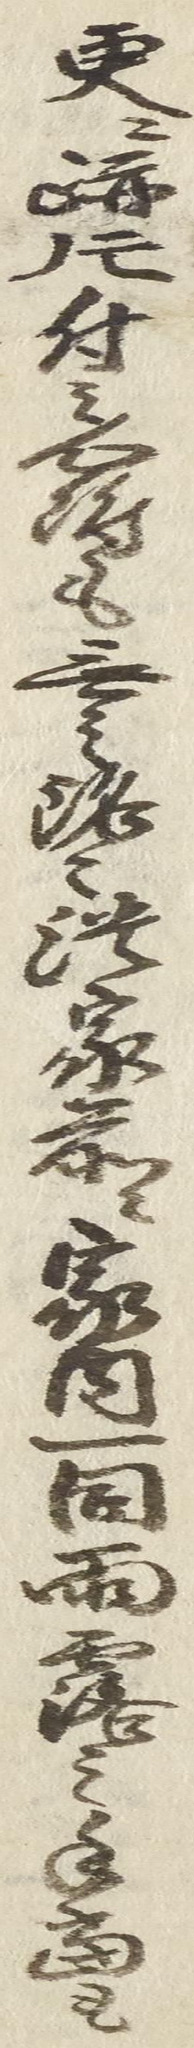更ニ跡片付之心附も無之銘々潰家前々家内一同雨露之手当も
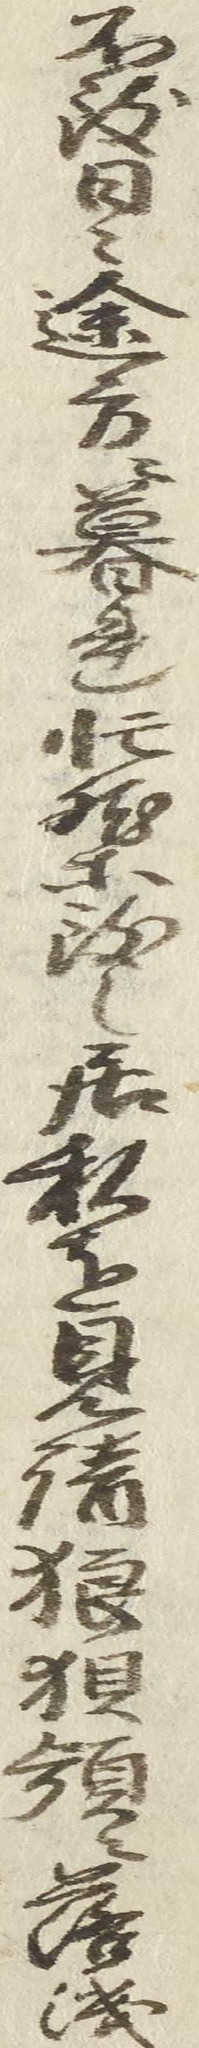不致日々途方ニ暮れ忙然等致し居私を見諸狼狽頻ニ落儀
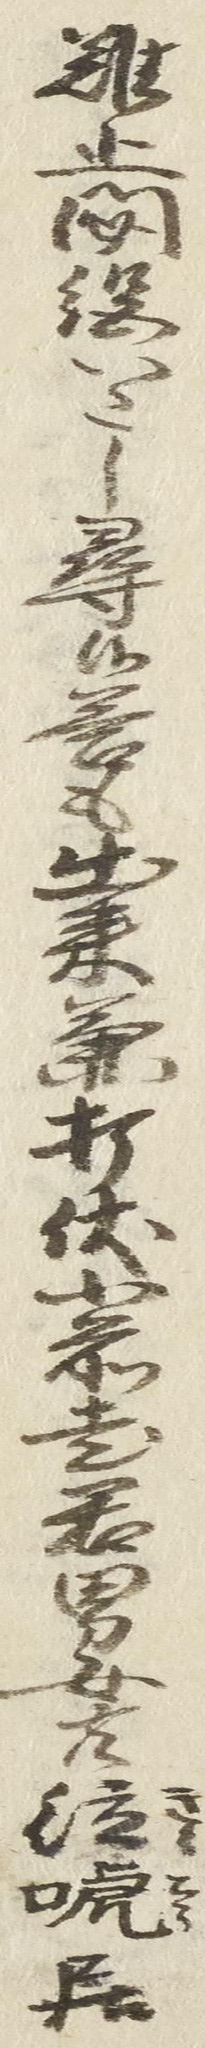難止悶絶いたし尋候答も出来兼打伏小前老若男女共泣嗁ニ候
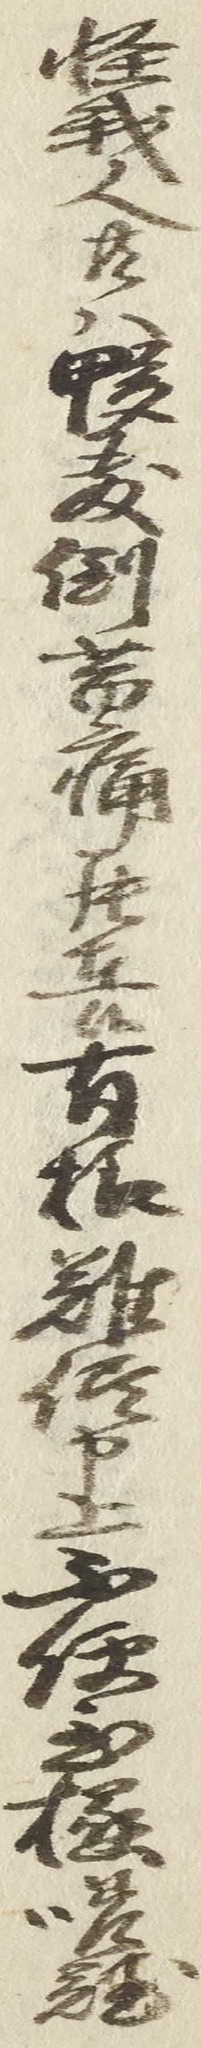怪我人共は夥敷倒苦痛罷在候有様難尽申上不便至極嗟歎
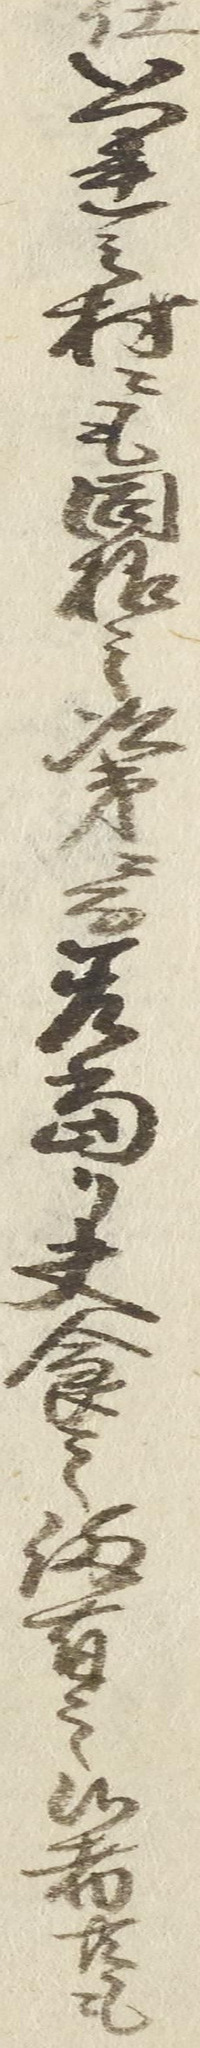仕いつれ村々ニも同様之次第ニ而差当夫食之備有之候者共も
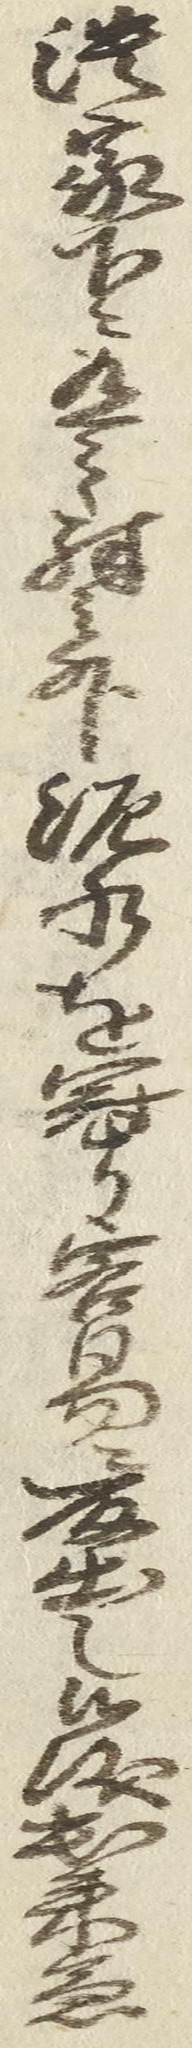潰家下々有之殊之外泥水を冠り容易ニ取出し候儀出来兼
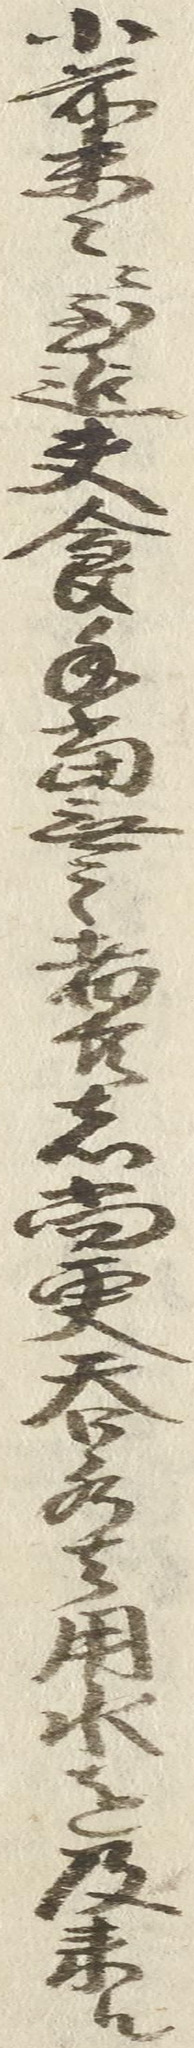小前末々ニ至迄夫食手当無之者共は尚更呑水は用水を及来ル
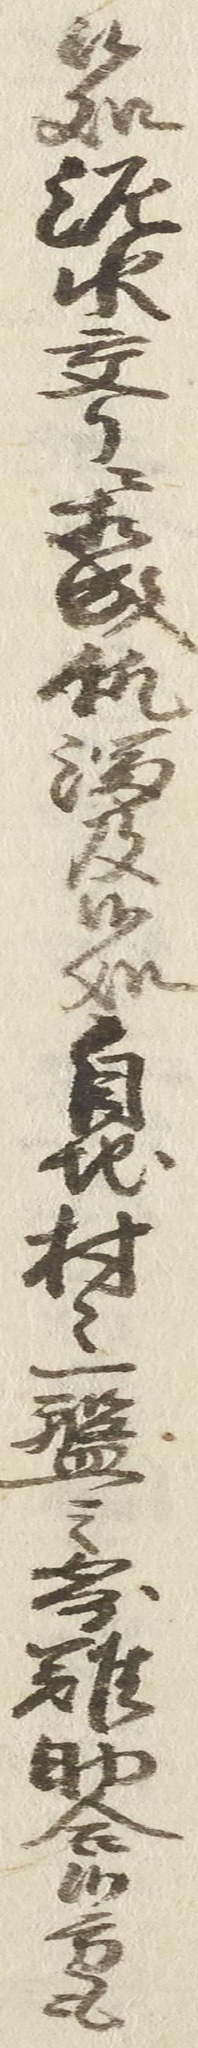候処泥水交りニ相成飢渇及候処自地村々一盤之寄難助合候方も
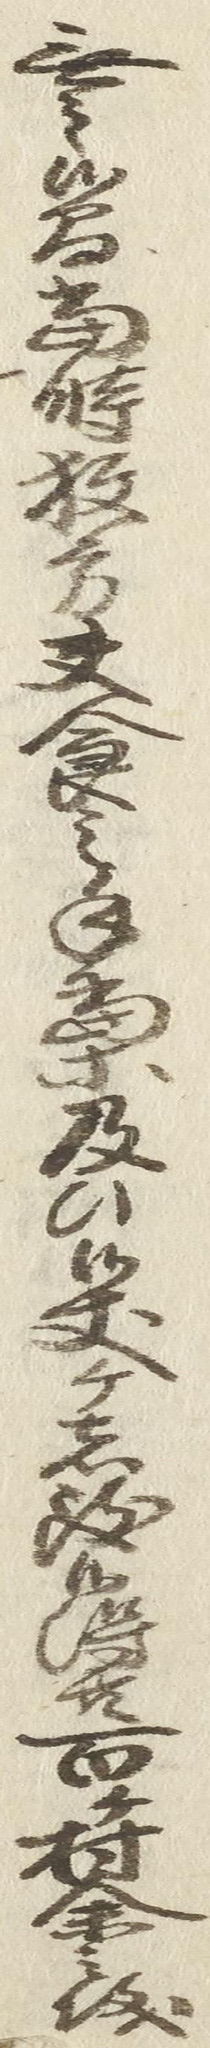無之候間当時救方夫食之手当等及ひ候丈ケは致候得共百ヶ村余之儀
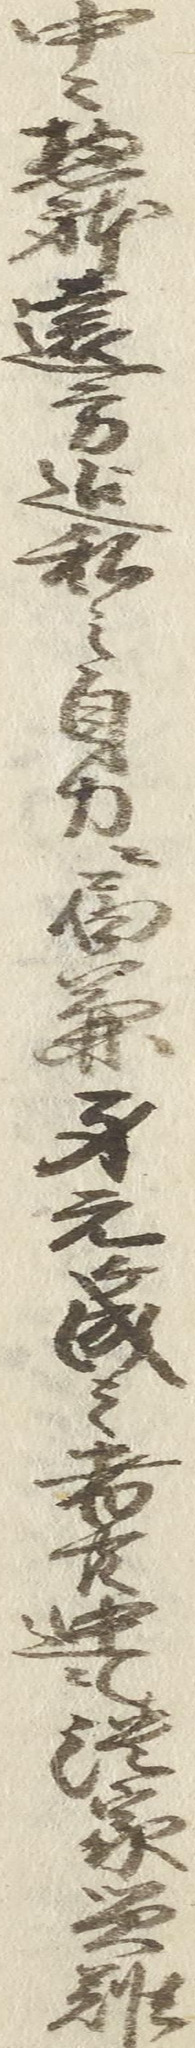中々惣体遠方迄私之自力ニ届兼身元ヶ成之者共迚も潰家災難ニ
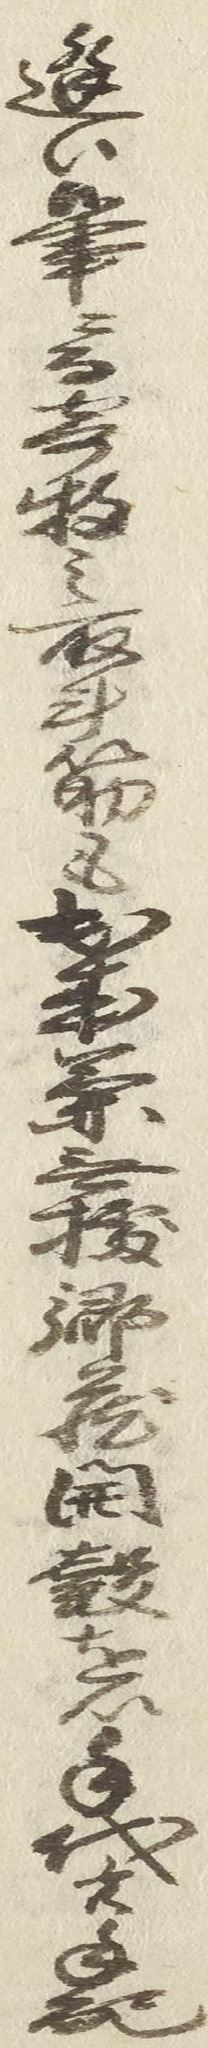逢ひ候事ニ而奇特之取計筋も出来兼無拠郷蔵開穀を以手代共手配
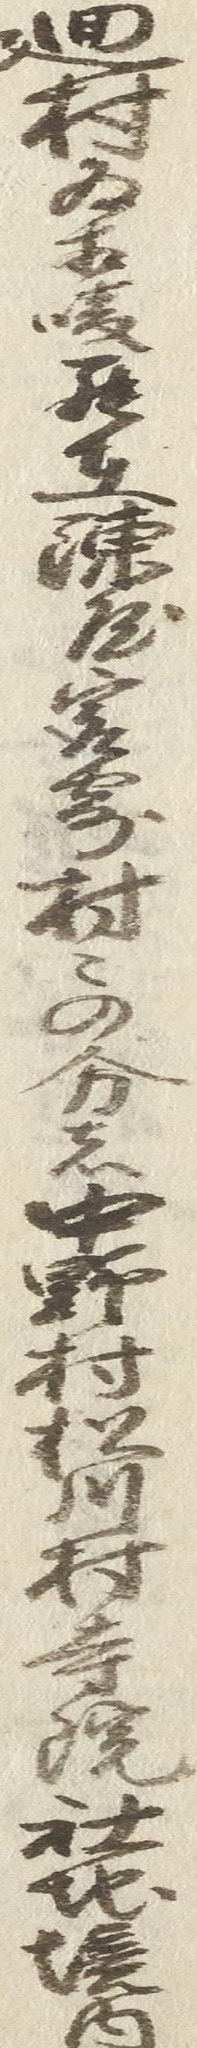廻村為相凌罷在陣屋最寄村々の分は中野村松川村寺院社地境内
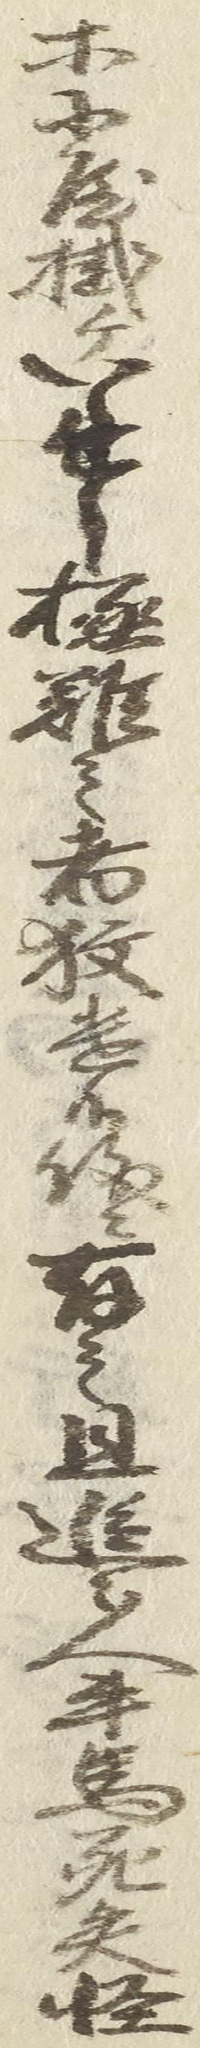等小屋掛ケいたし極難之者救遣候儀ニ有之且追々人牛馬死失怪
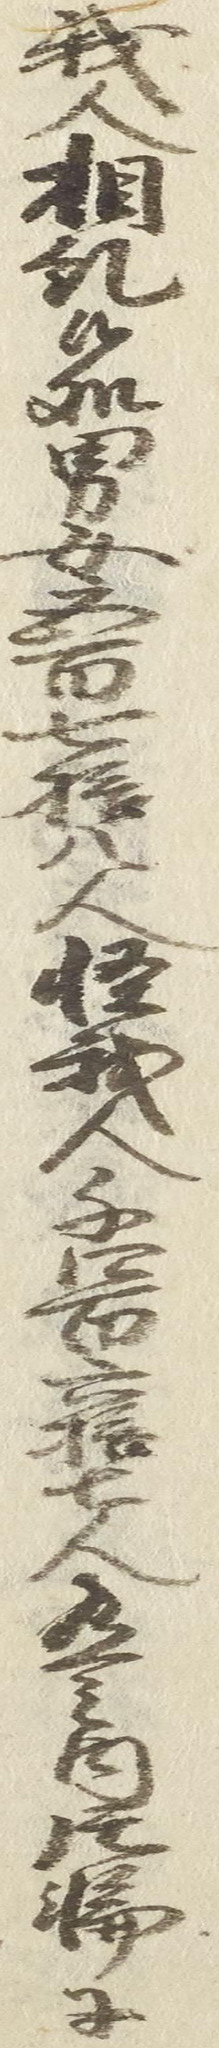我人相糺候処男女五百七拾八人怪我人千四百六拾七人有之内片輪に
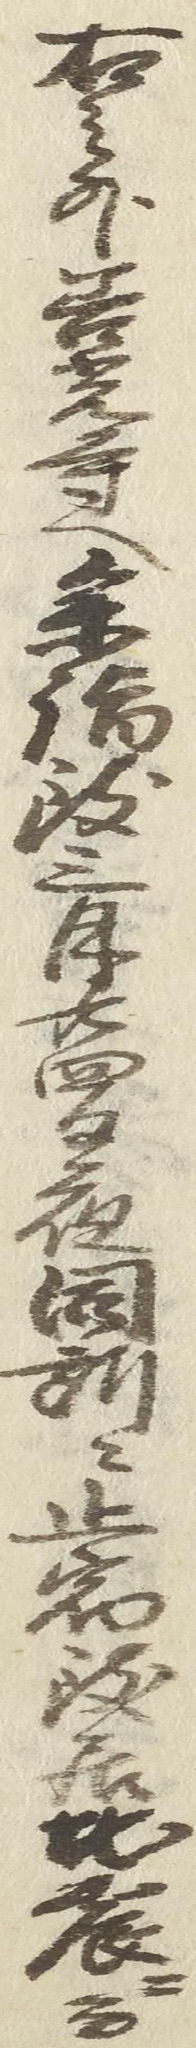右之外善光寺へ参詣致三月廿四日夜同所ニ止宿致居地震ニ而

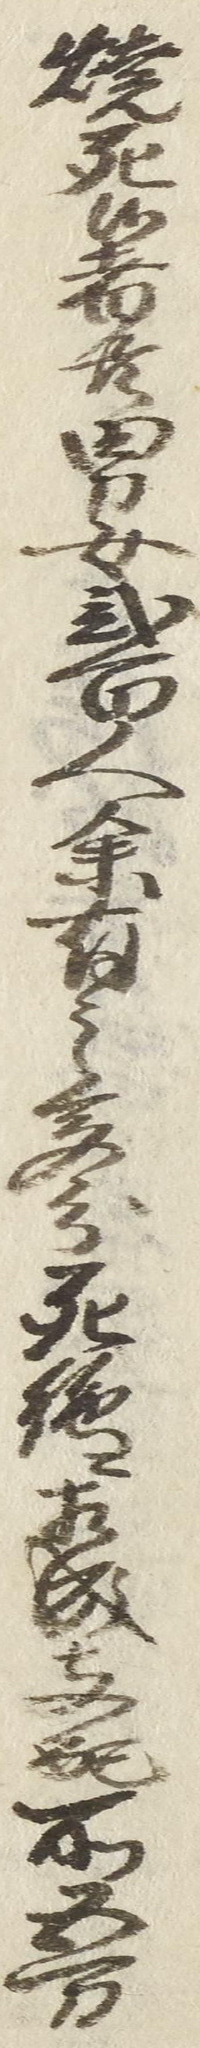焼死候者共男女弐百人余有之多分死絶ニ相成支配所五万
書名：従往古地震御届書記誌之一
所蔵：東京大学地震研究所図書室 Earthquake Research Institute Library, The University of Tokyo, JAPAN
